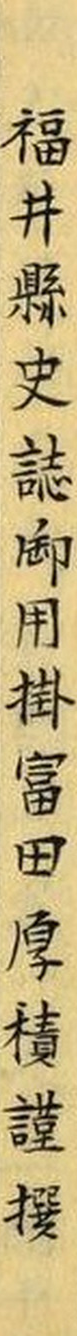福井縣史誌御用掛富田厚積謹撰
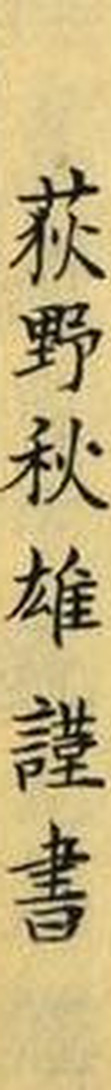仝荻野秋雄謹書

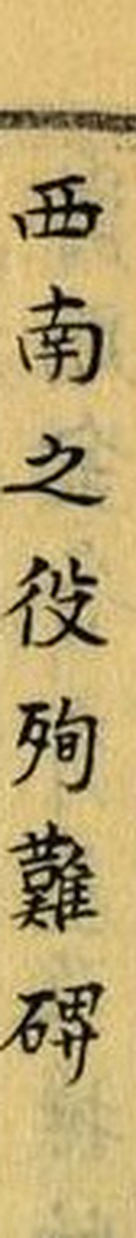西南之役殉難碑
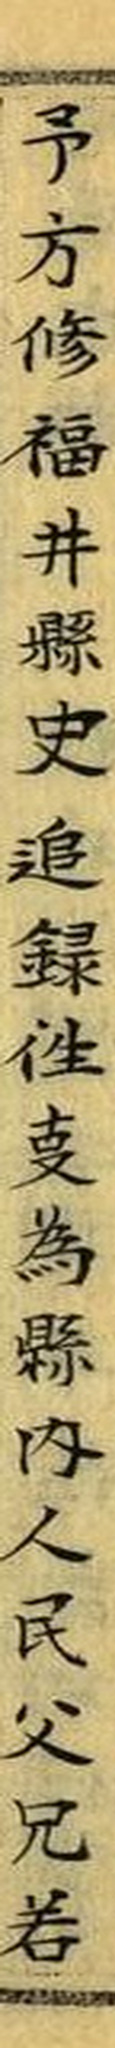予方修福井縣史追録往叓為縣内人民父兄若
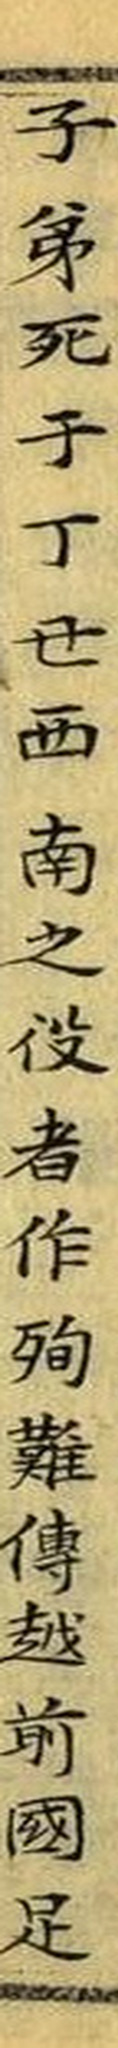子弟死于丁丑西南之役者作殉難傳越前國足
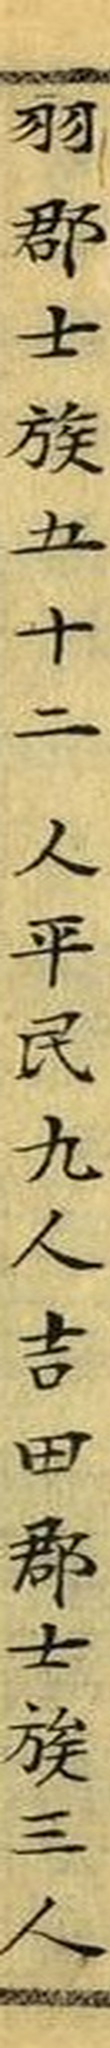羽郡士族五十二人平民九人吉田郡士族三人
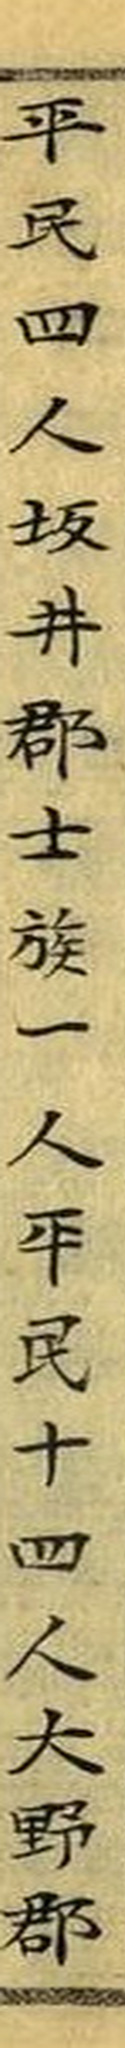平民四人坂井郡士族一人平民十四人大野郡
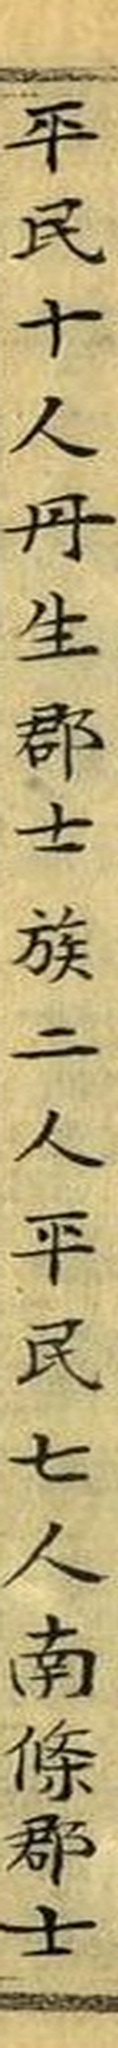平民十人丹生郡士族二人平民七人南條郡士
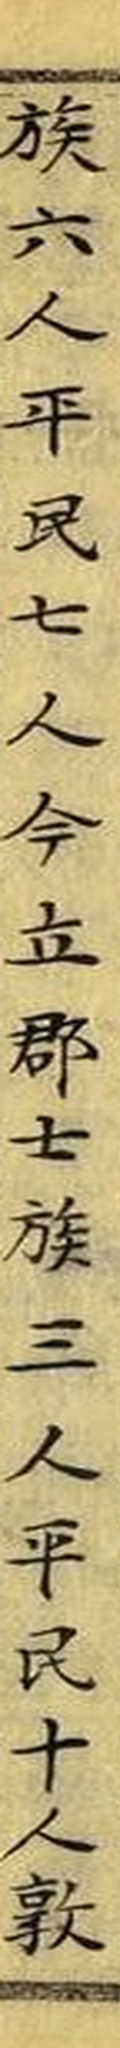族六人平民七人今立郡士族三人平民十人敦
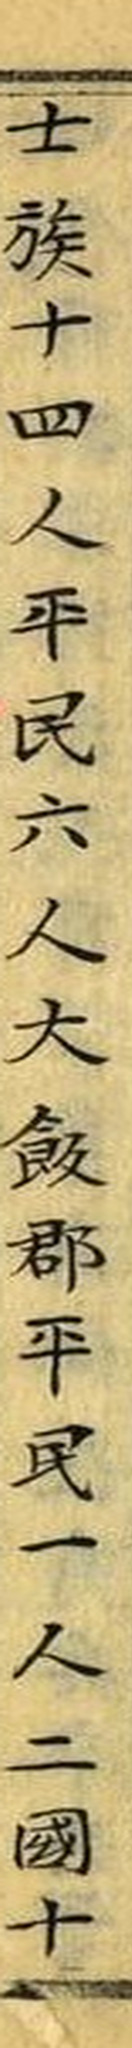士族十四人平民六人大飯郡平民一人二國十

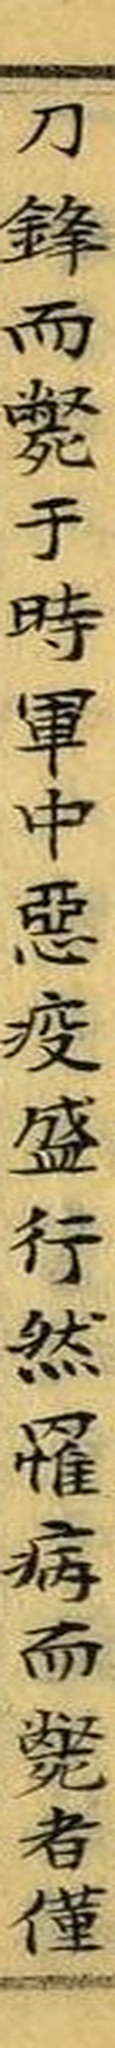刀鋒而斃于時軍中惡疫盛行然罹病而斃者僅
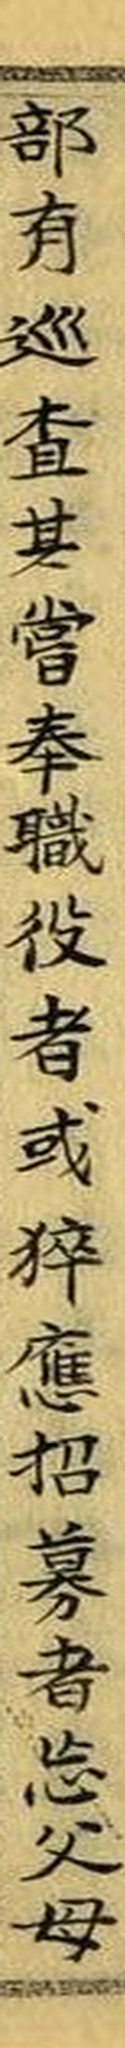部有巡査其嘗奉職役者或猝應招募者忘父母
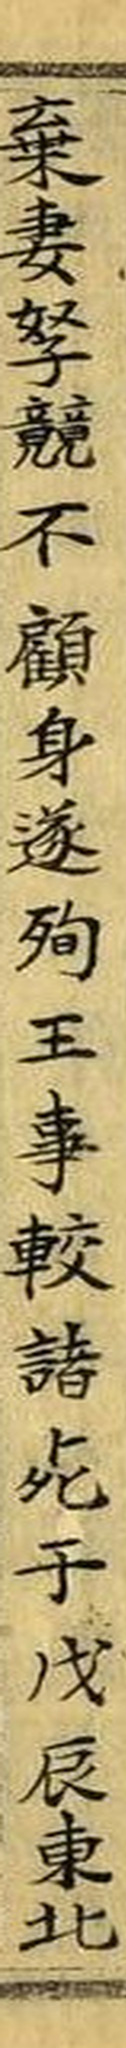棄妻孥競不顧身遂殉王事較諸死于戊辰東北
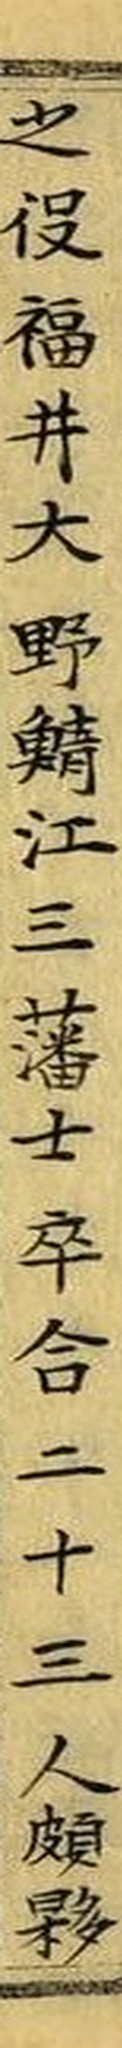之役福井大野鯖江三藩士卒合二十三人頗夥
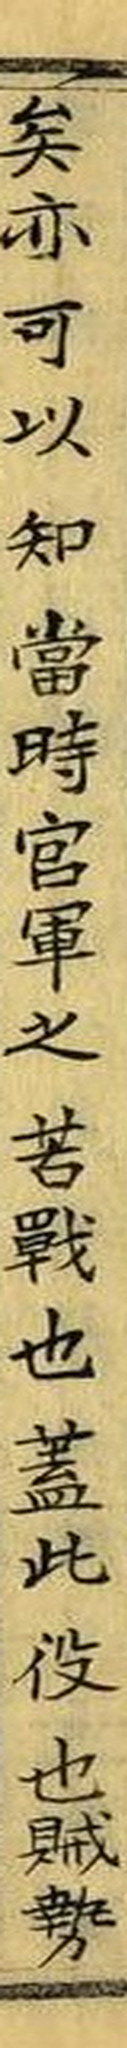矣亦可以知當時官軍之苦戰也蓋此役也賊勢
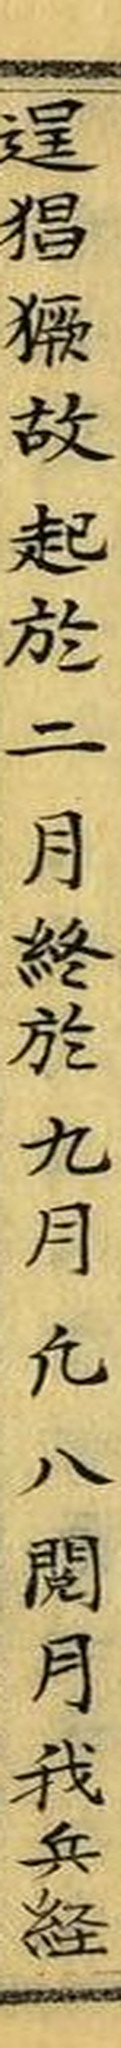逞猖獗故起於二月終於九月凡八閲月我兵経
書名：温古集 五巻
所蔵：福井県文書館 Fukui Prefectural Archives
